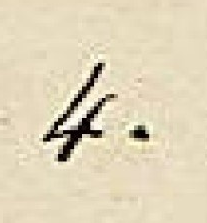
4.
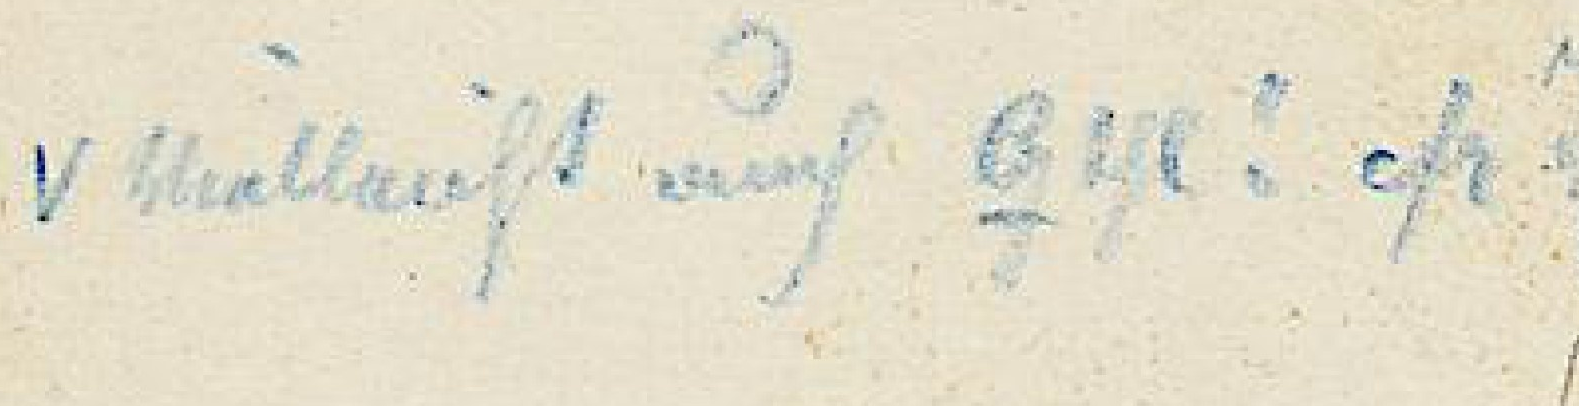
V Vielleicht auf Gshl! cf
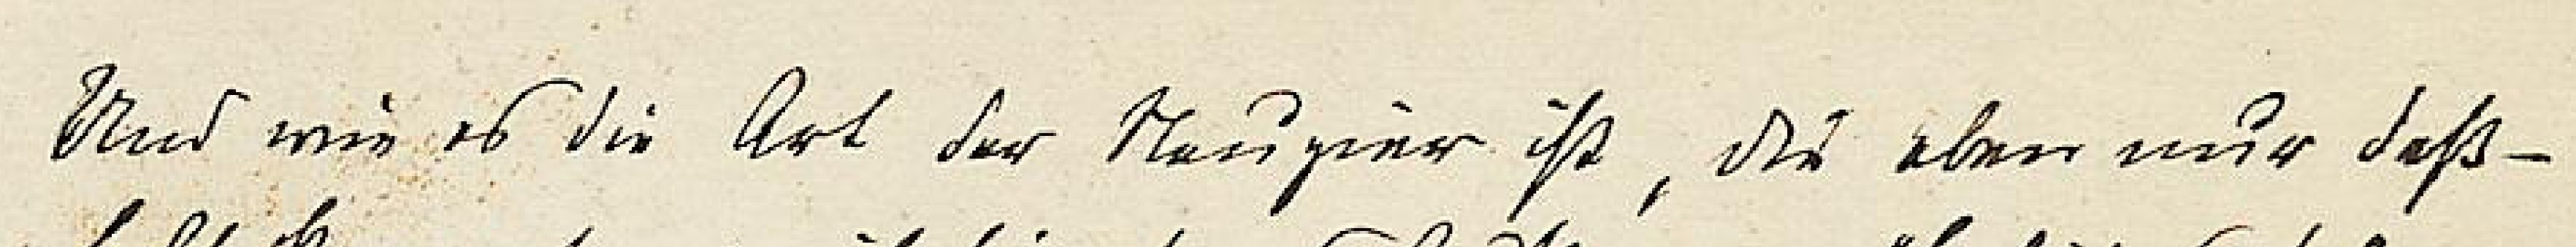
Und wie es die Art der Neugier ist, die eben nur deß¬
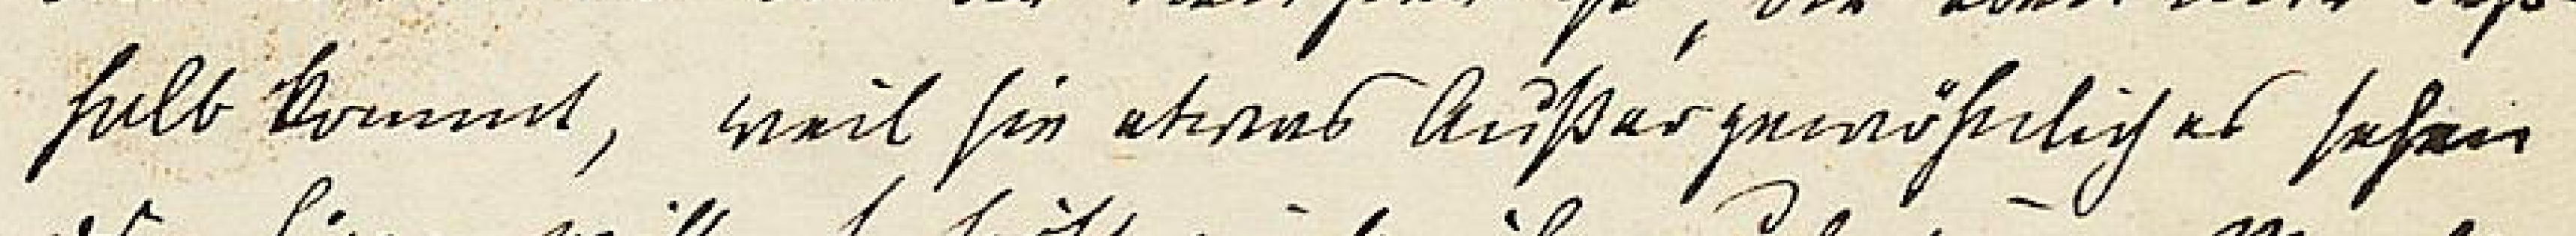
halb kommt, weil sie etwas Außergewöhnliches sehen
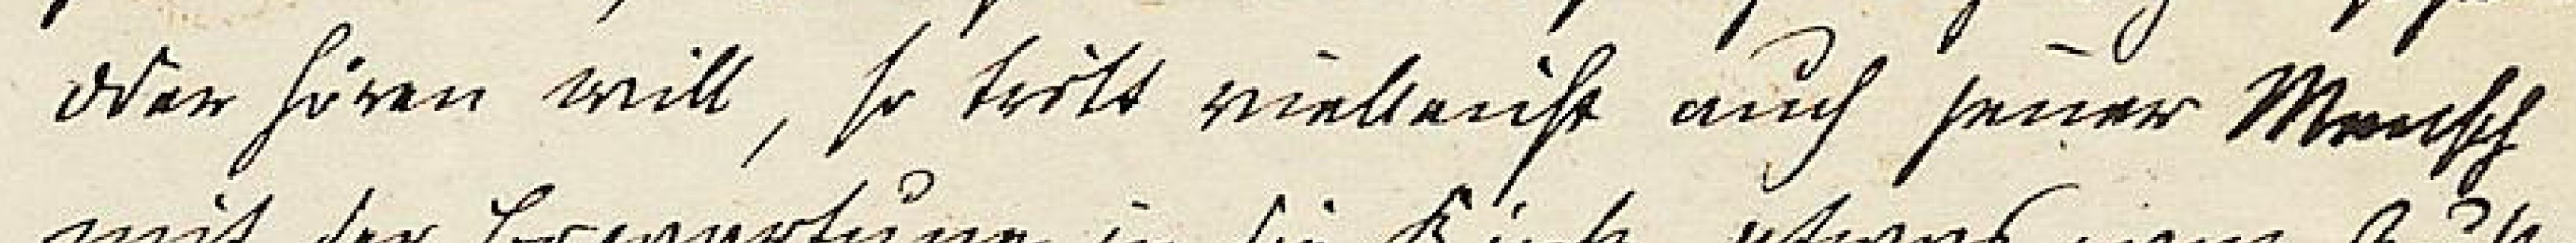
oder hören will, so tritt vielleicht auch jener Mensch
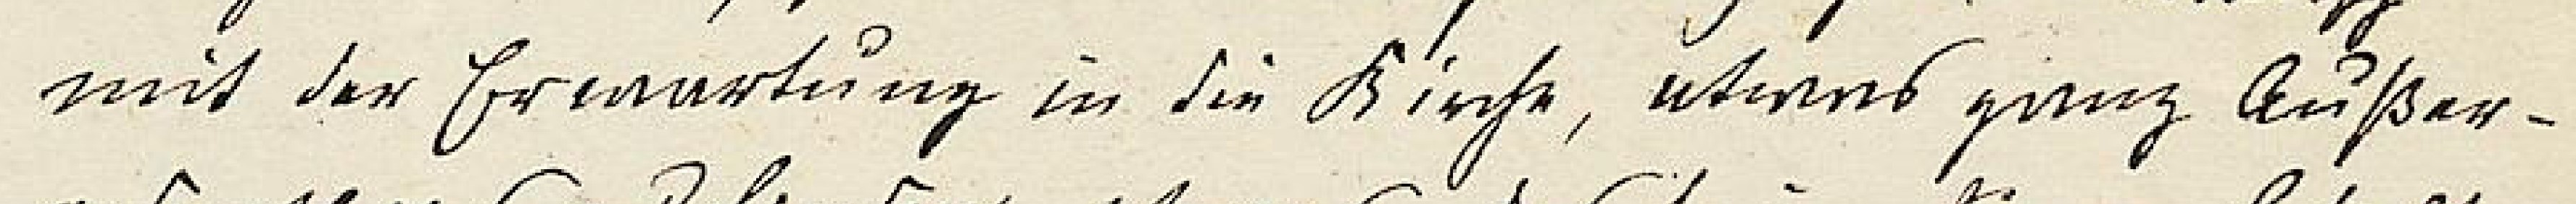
mit der Erwartung in die Kirche, etwas ganz Außer¬
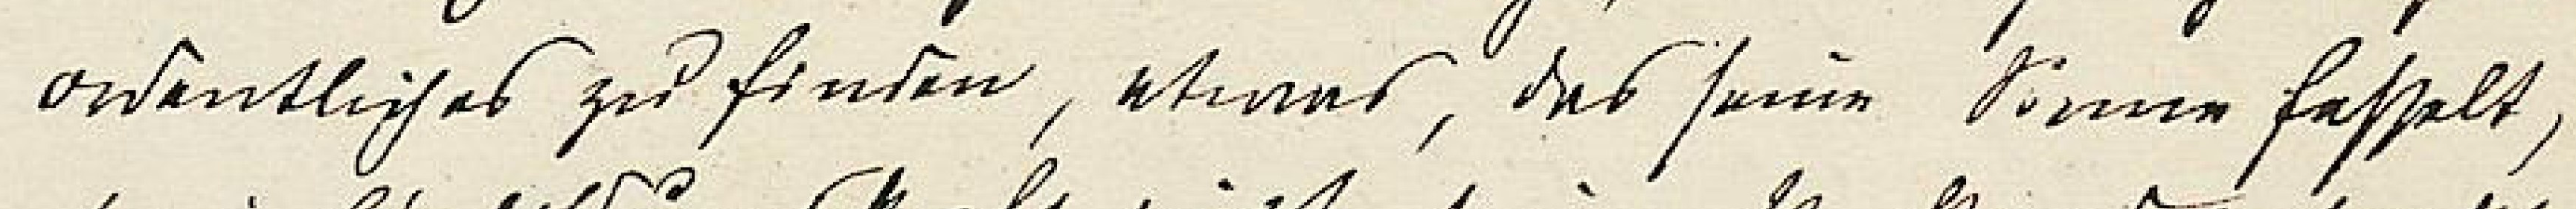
ordentliches zu finden, etwas, das seine Sinne fesselt,
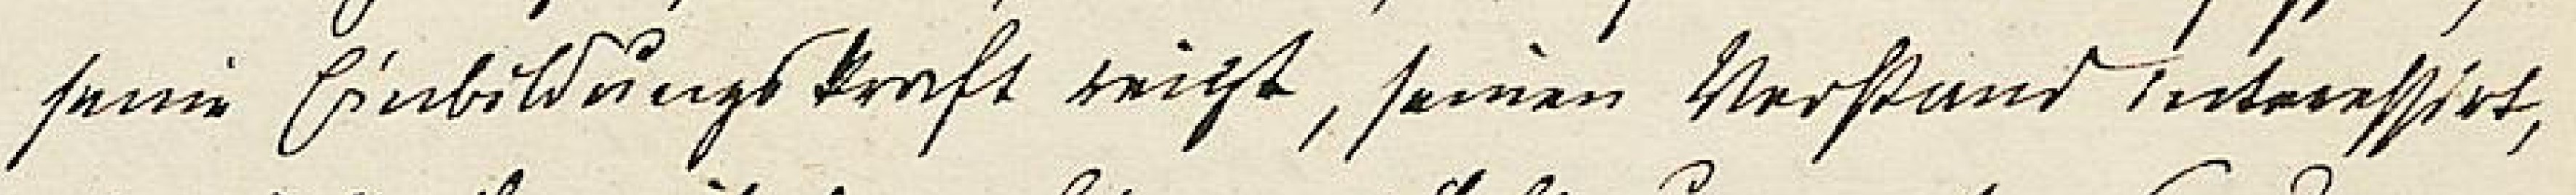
seine Einbildungskraft reizt, seinen Verstand interessiert,
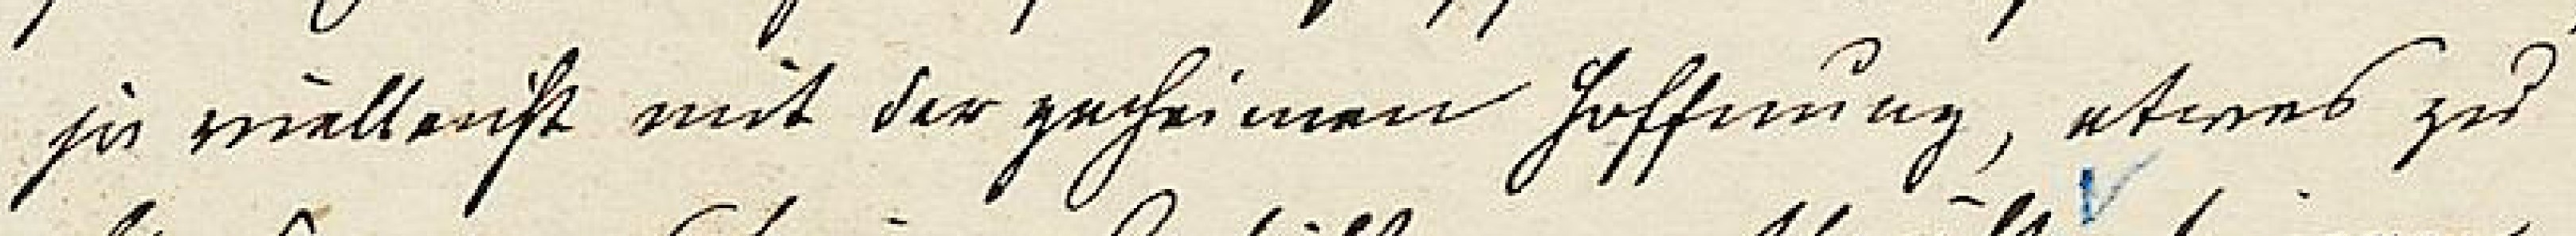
ja vielleicht mit der geheimen Hoffnunug, etwas zu
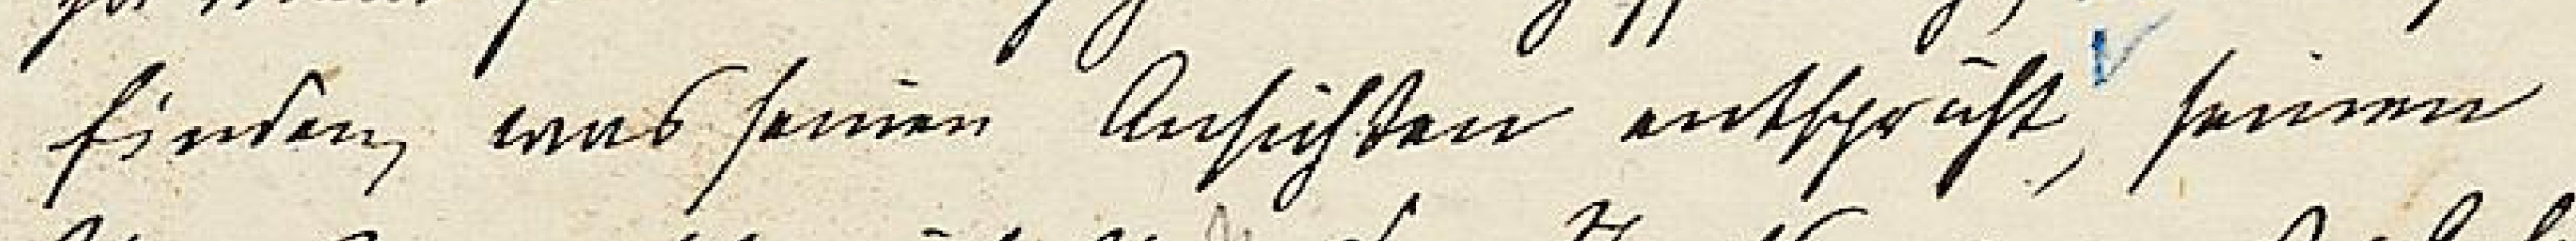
finden, was seinen Ansichten entspricht, seinen
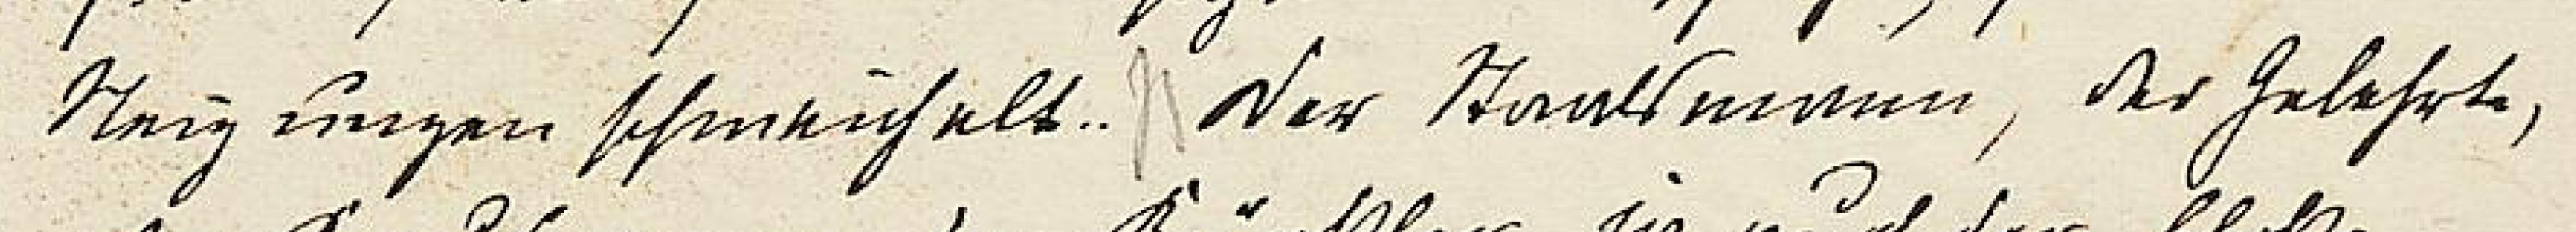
Neingungen schmeichelt. Der Staatsmann, der Gelehrte,
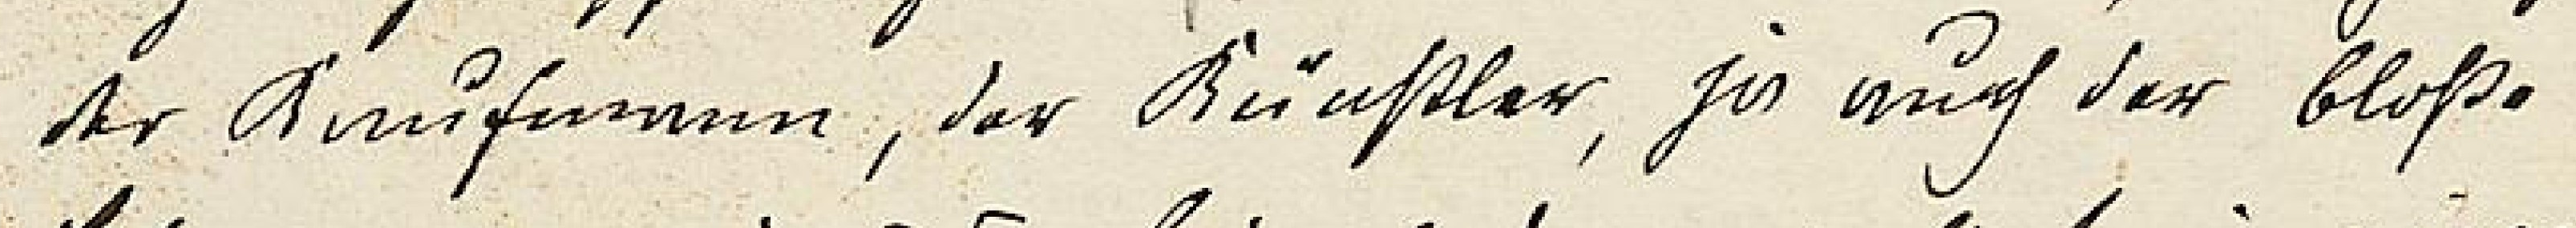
der Kaufmann, der Küstler, ja auch der bloße
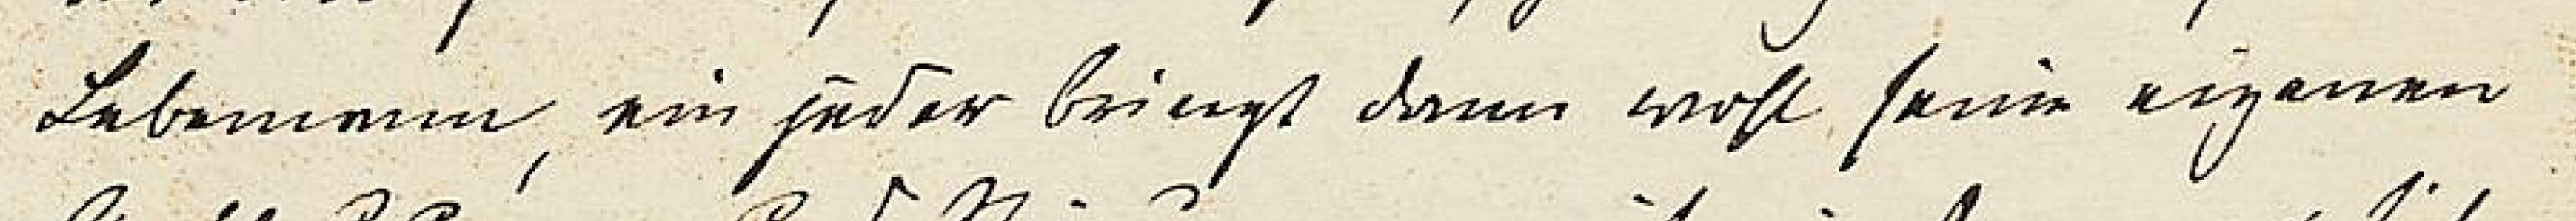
Lebenmann, ein jeder bingt dann wohl seine eigenen
